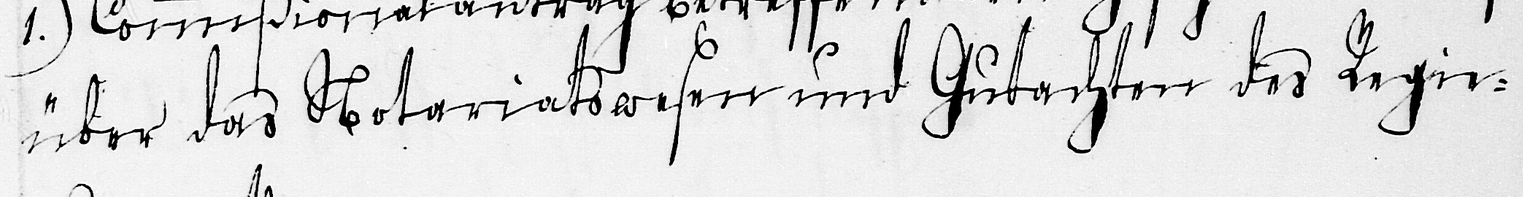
über das Notariatswesen und Gutachten des Regie¬
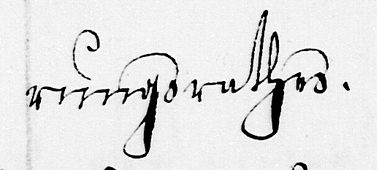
rungsrathes.
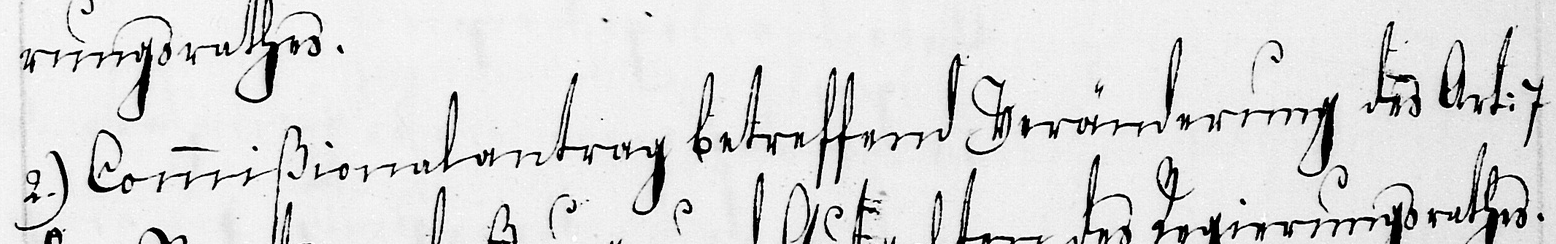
2.) Commißionalantrag betreffend Veränderung des Art:
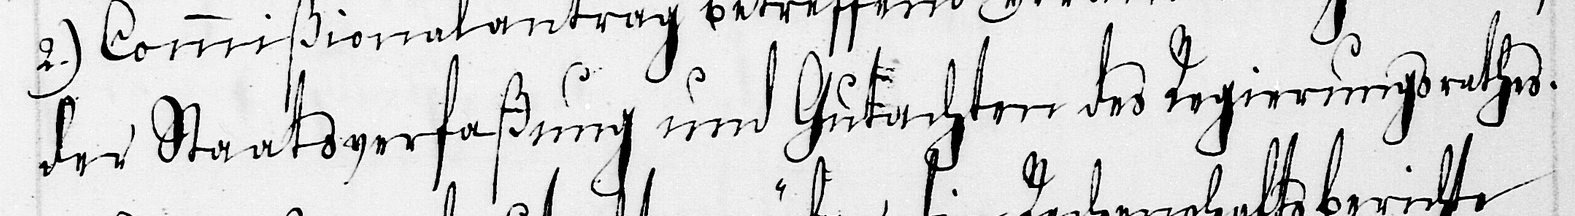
der Staaatsverfaßung und Gutachten des Regierungsrathes.
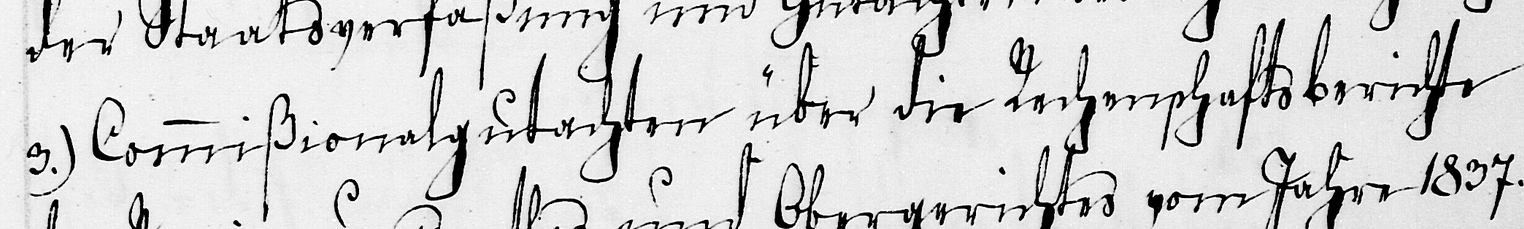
3.) Commißionalgutachten über die Rechenschaftsberichte
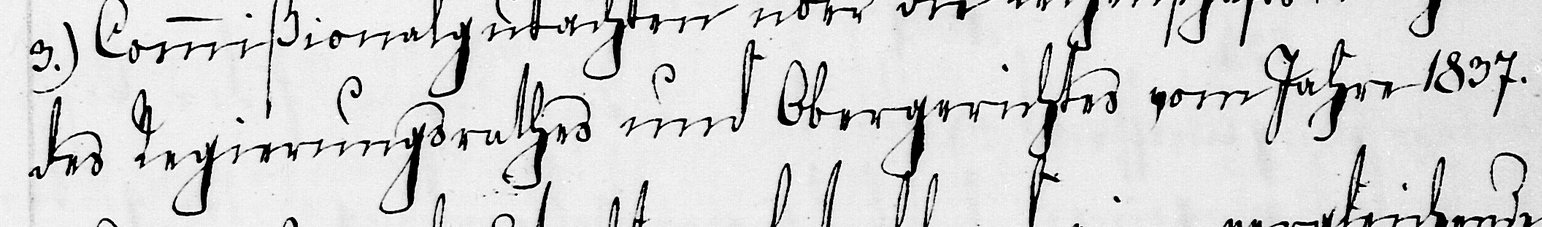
des Regierungsrathes und Obergerichtes vom Jahre 1837.
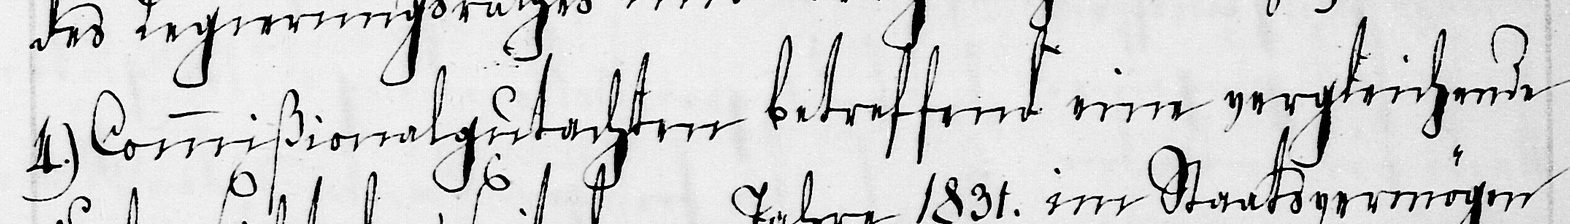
4.) Commißionalgutachten betreffend eine vergleichende
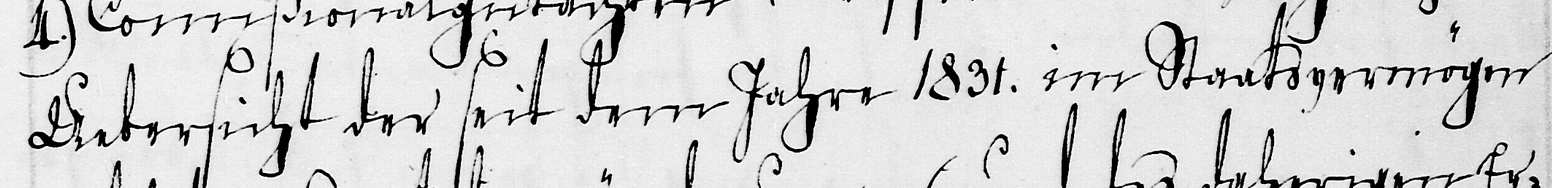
Uebersicht der seit dem Jahre 1831. im Staatsvermögen
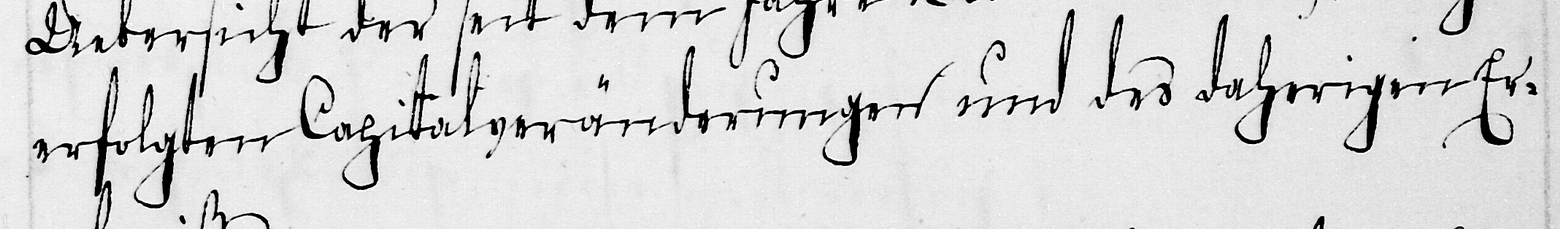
erfolgten Capitalveränderungen und des daherigen Er¬
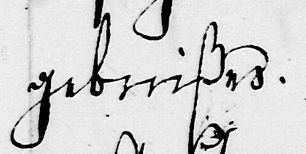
gebnißes.
